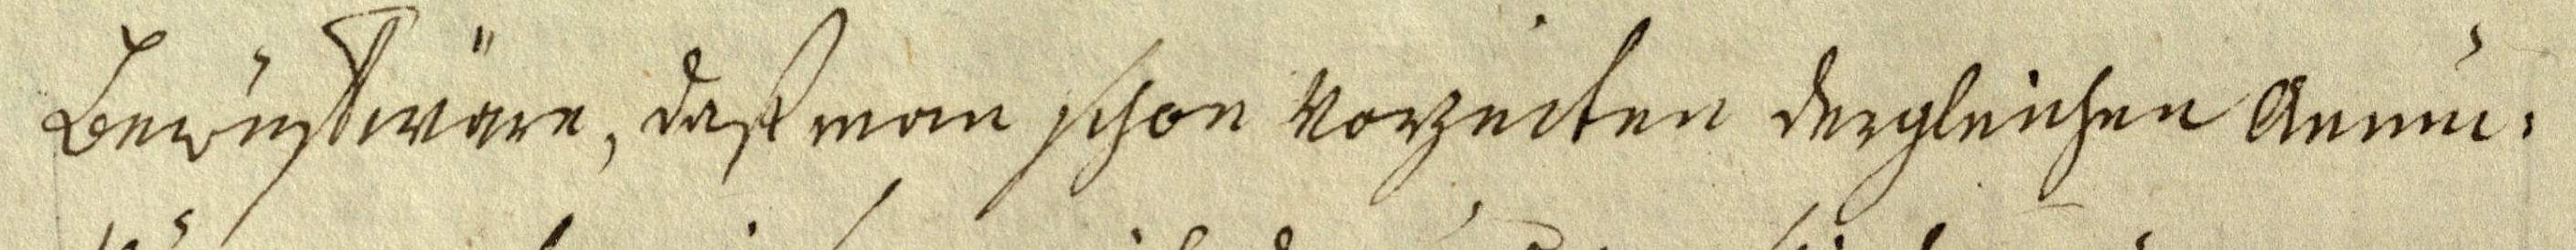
Bewußt wäre, daß man schon vorzeiten dergleichen Anmu¬
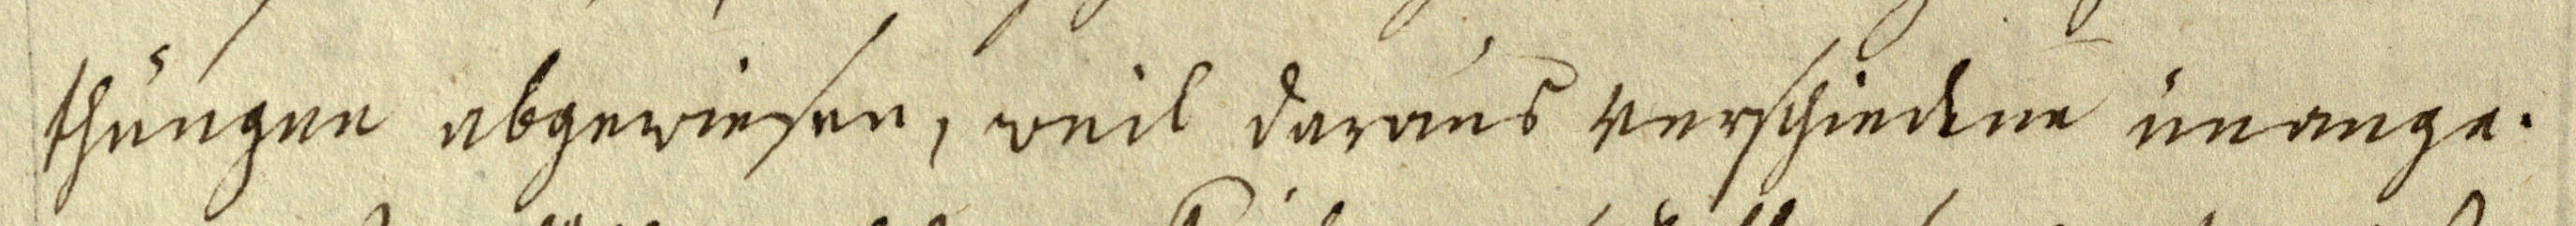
thungen abgewiesen, weil daraus verschiedene unange¬
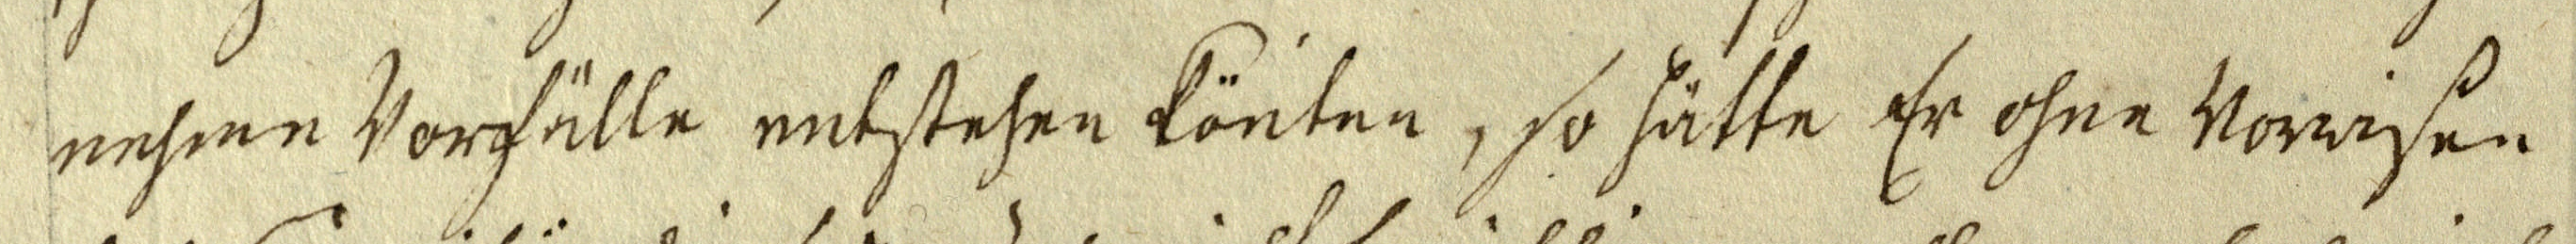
nehme Vorfälle entstehen könten, so hätte Er ohne Vorwißen
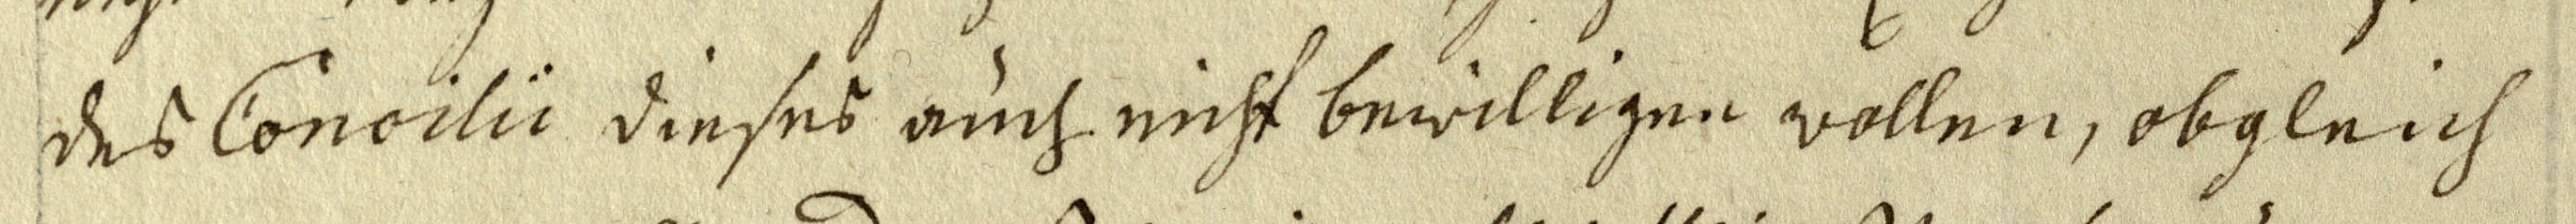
des Concilii dieses auch nicht bewilligen wollen, obgleich
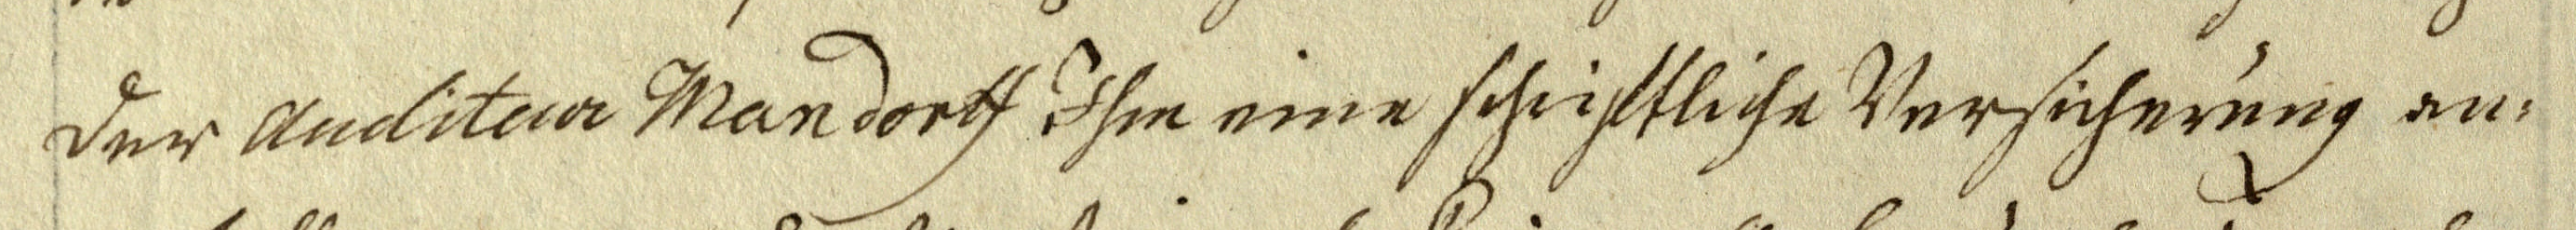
der Auditeur Mandorff Ihm eine schriftliche Versicherung an¬
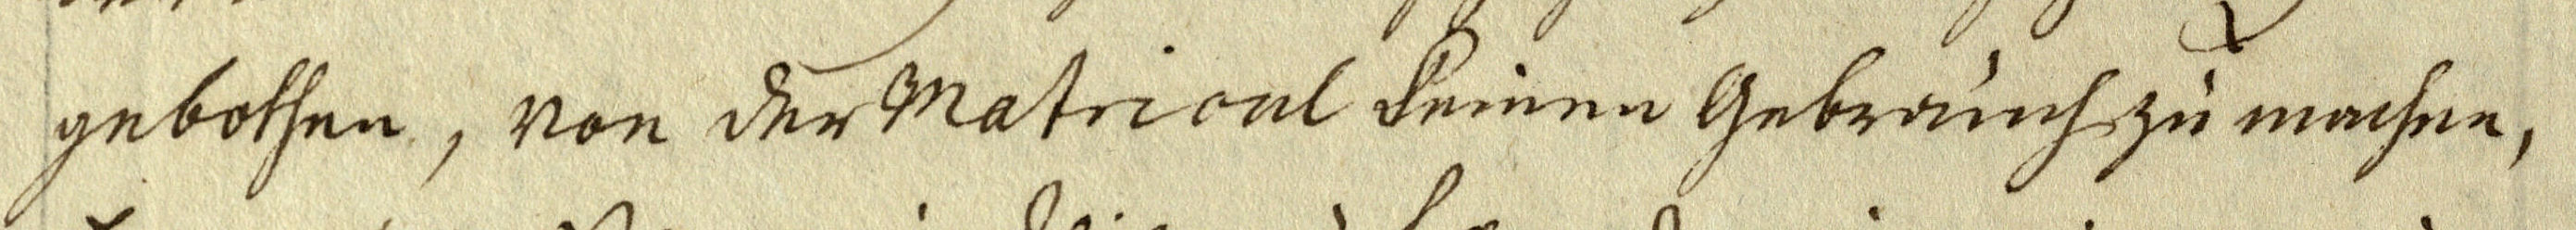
gebothen, von der Matricul keinen Gebrauch zu machen,
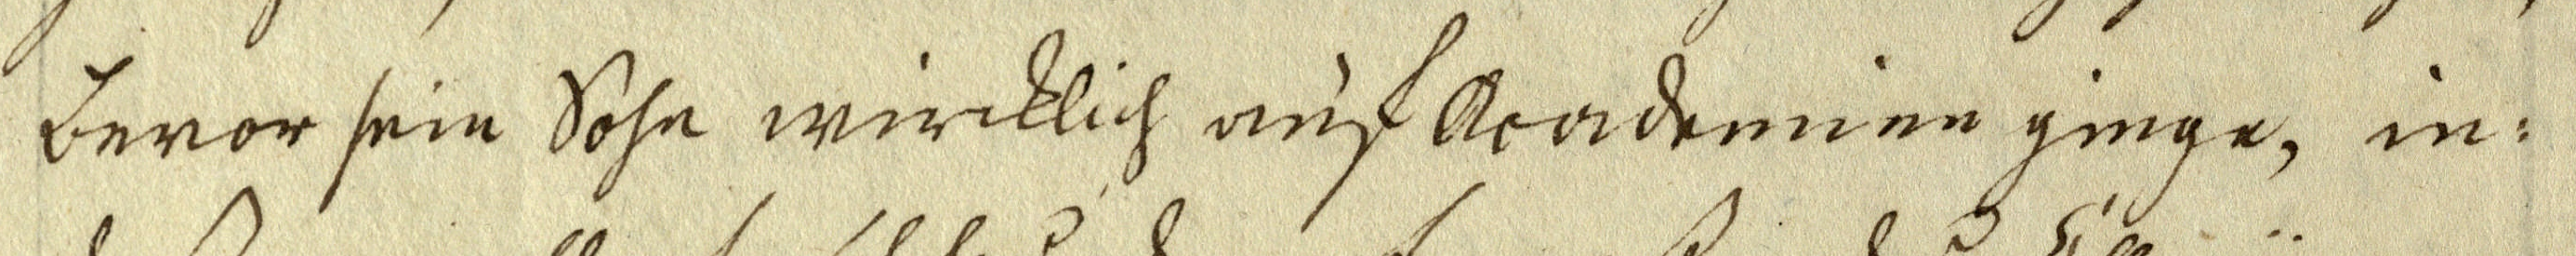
bevor sein Sohn wircklich auf Academien ginge, in¬
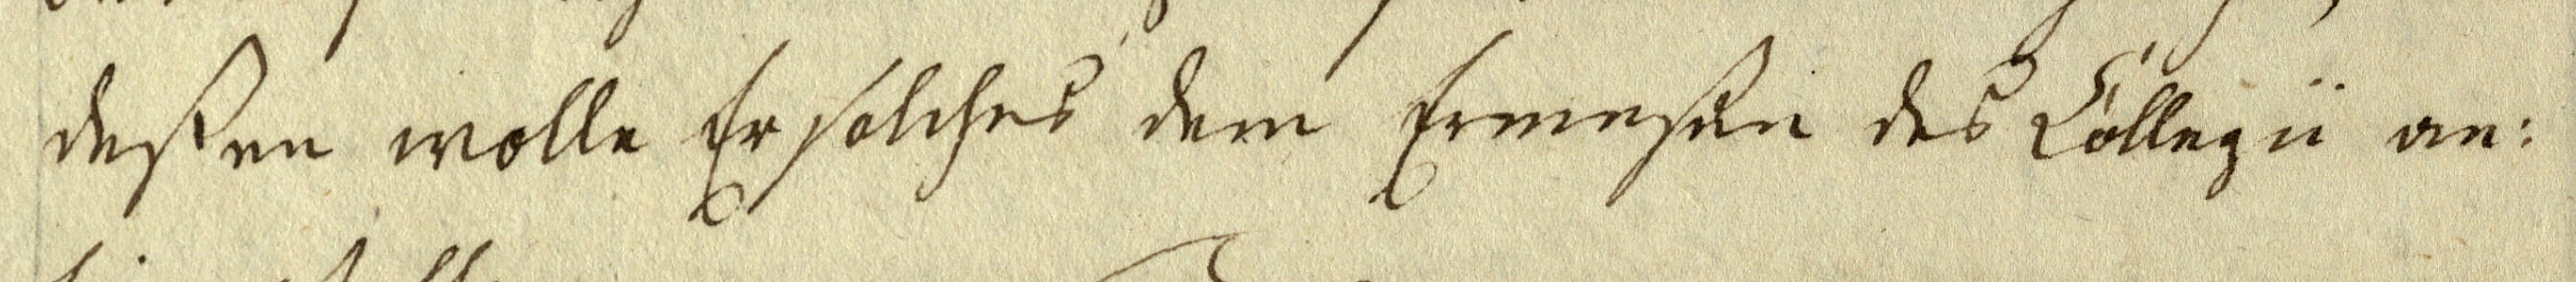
deßen wolle Er solches dem Ermeßen des Collegii an¬
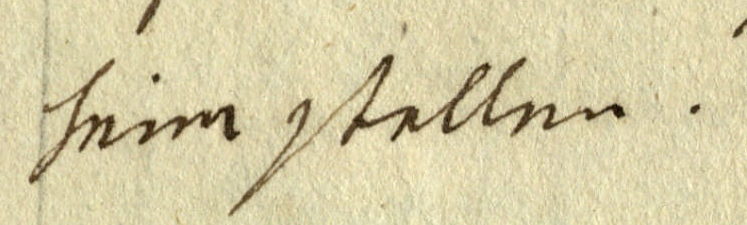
heim stellen.
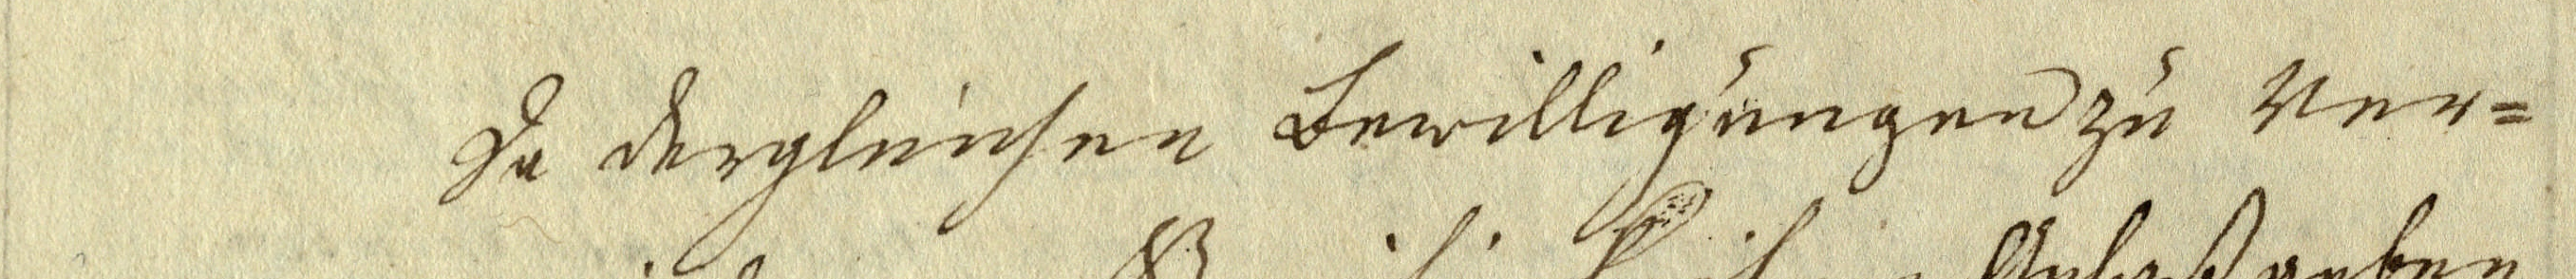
da dergleichen Bewilligungen zu ver¬
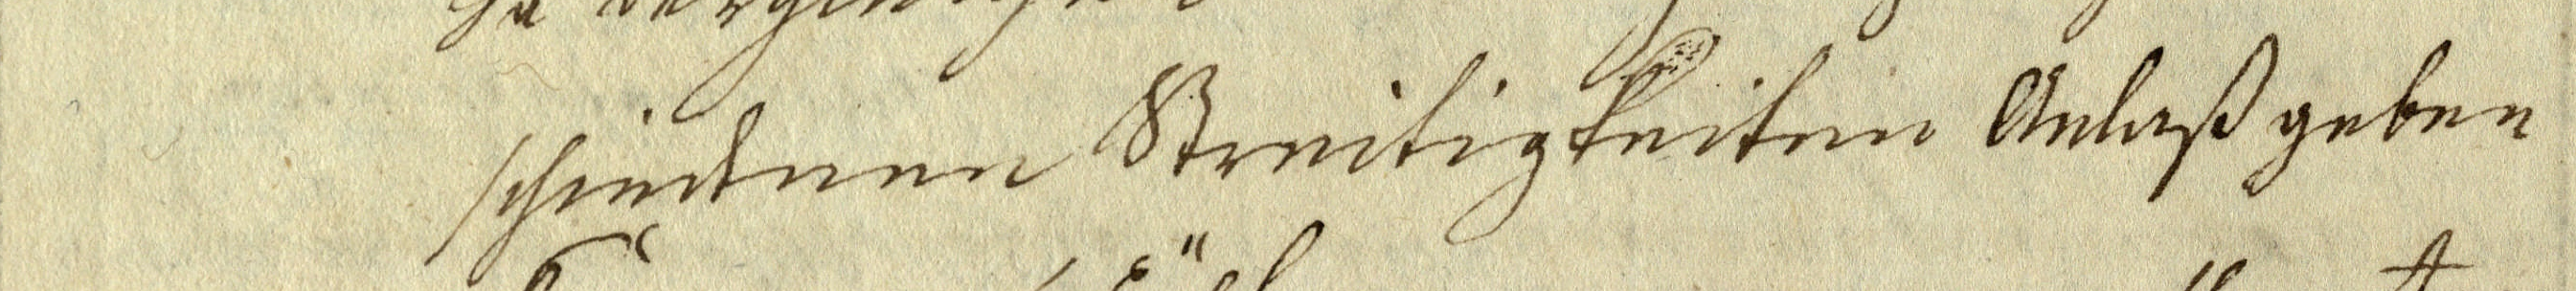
schiedenen Streitigkeiten Anlaß geben
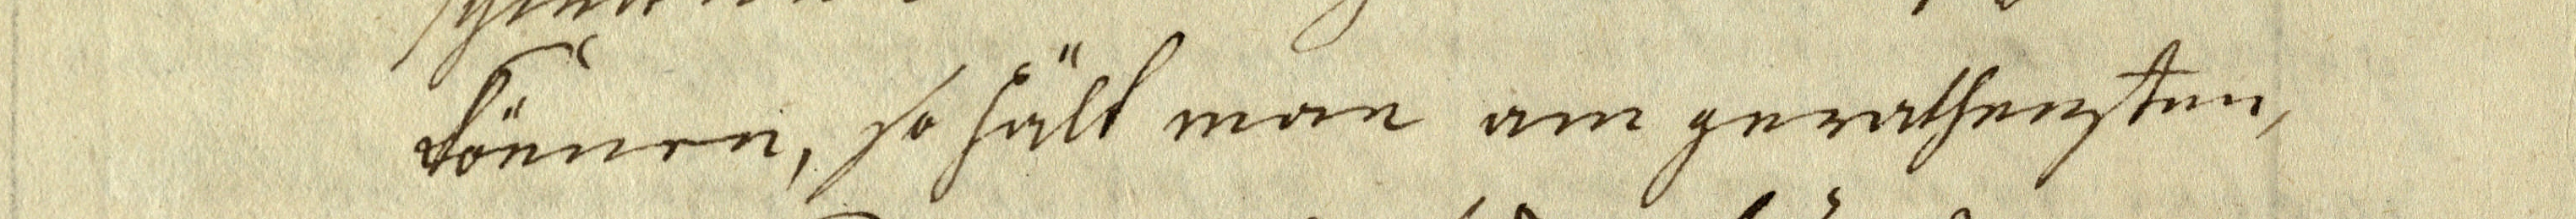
können, so hält man am gerathensten,
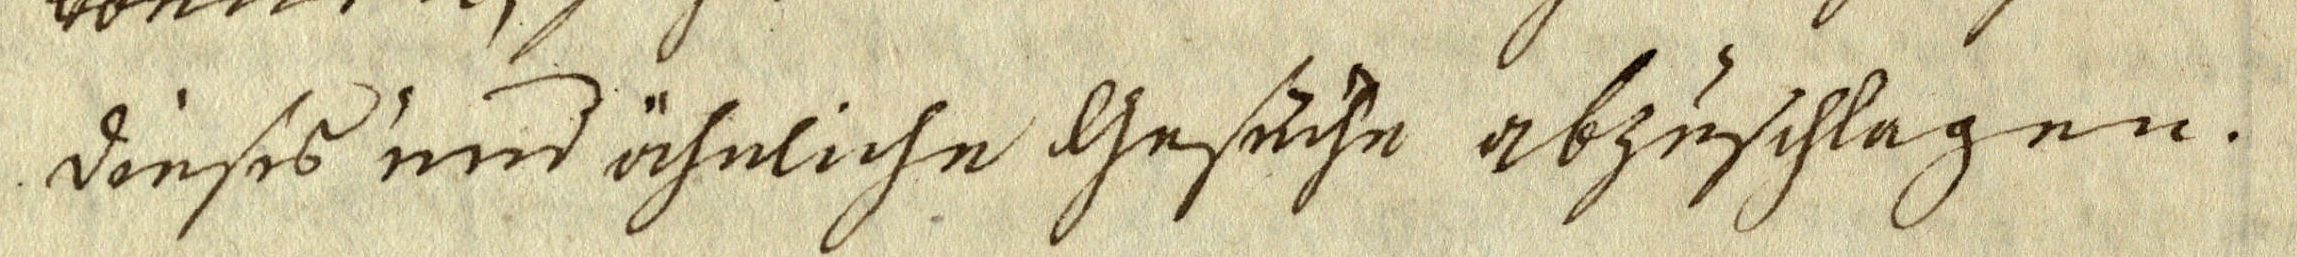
dieses und ähnliche Gesuche abzuschlagen.
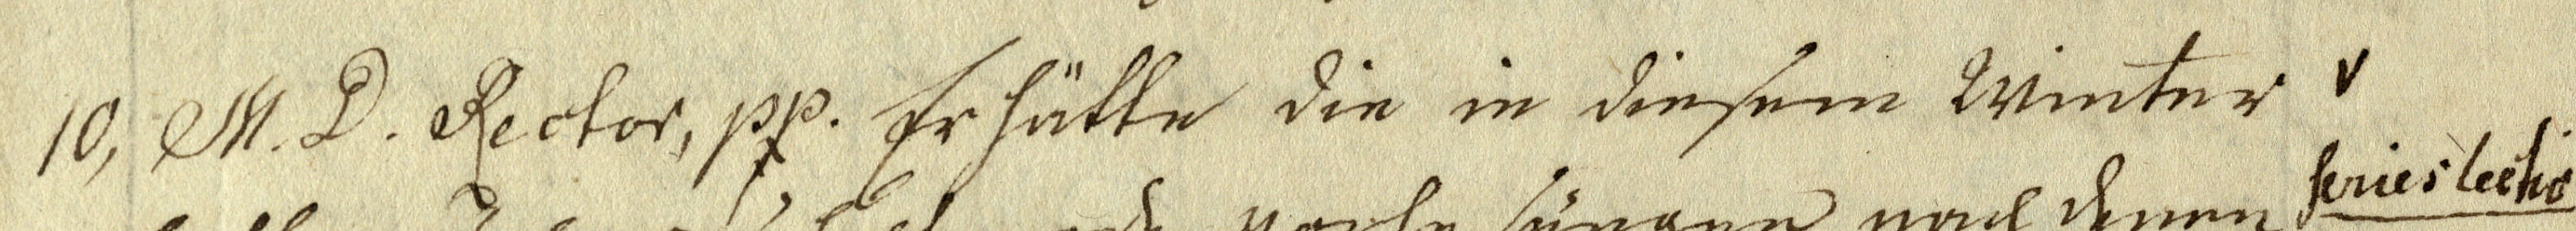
10, M. D. Rector, pp. Er hätte die in diesem Winter
